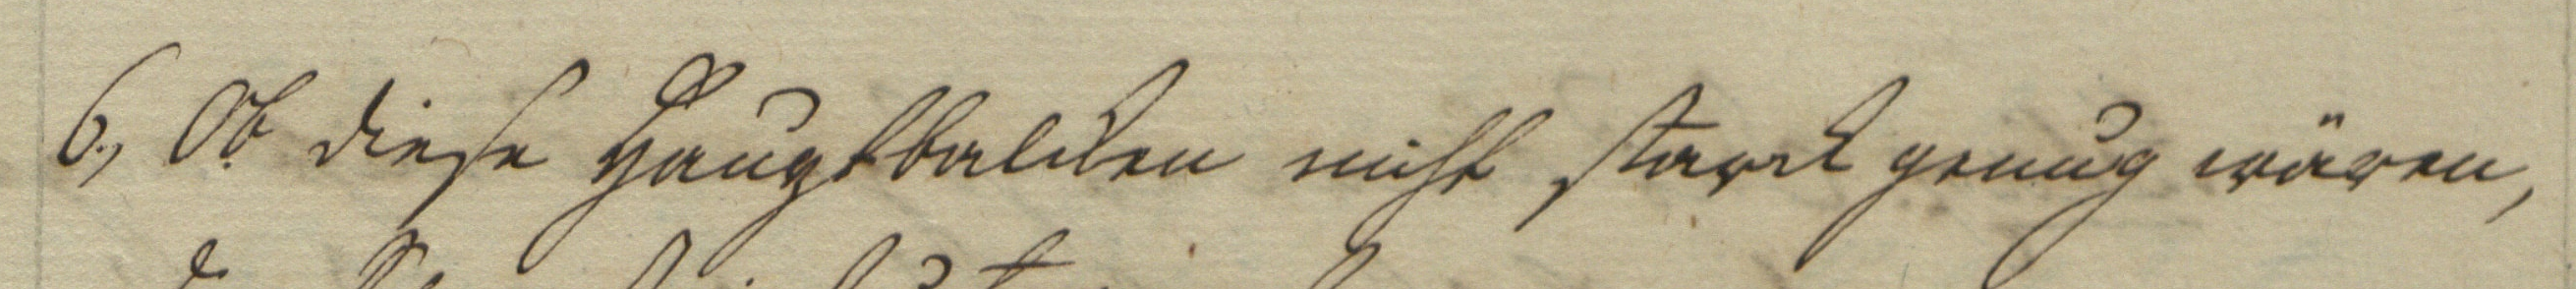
6., Ob diese Hauptbalcken nicht starck genug wären,
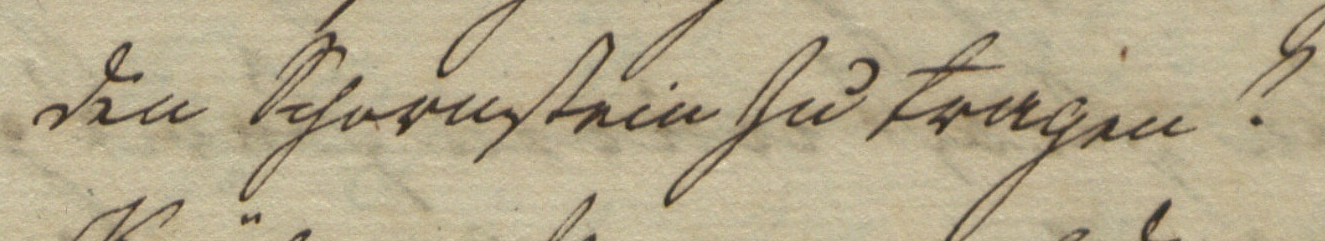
den Schornstein zu tragen?
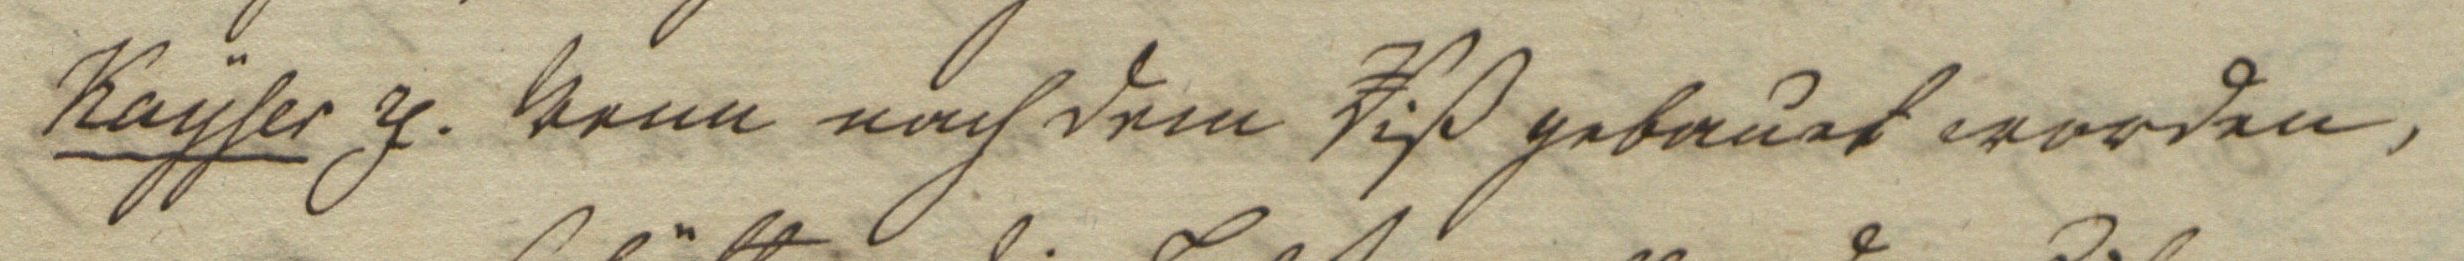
Kaÿser rf. Wenn nach dem Riß gebauet worden,
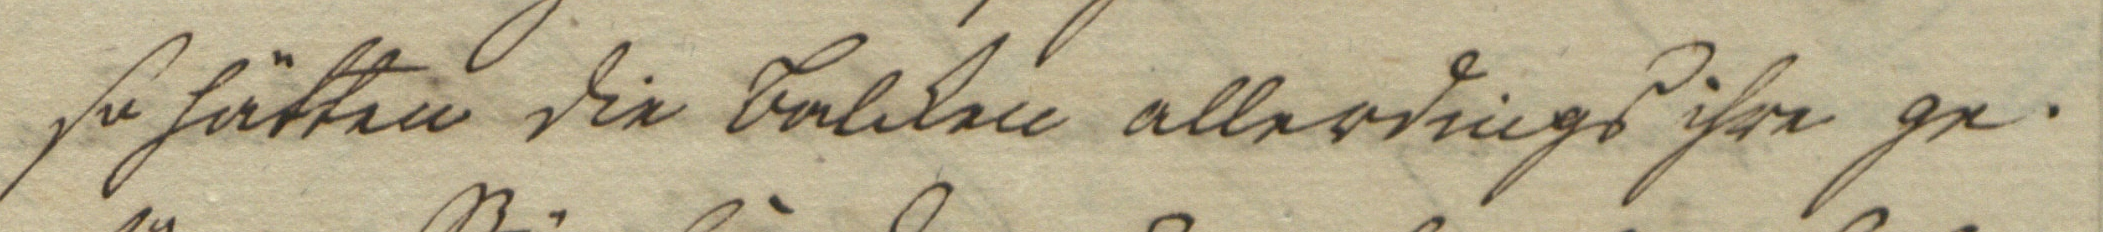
so hätten die Balcken allerdings ihre ge¬
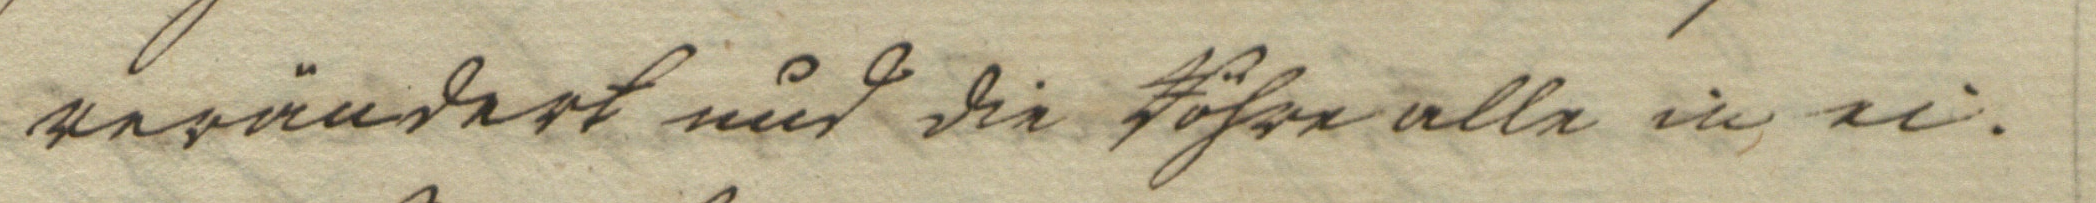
verändert und die Röhre alle in ei¬
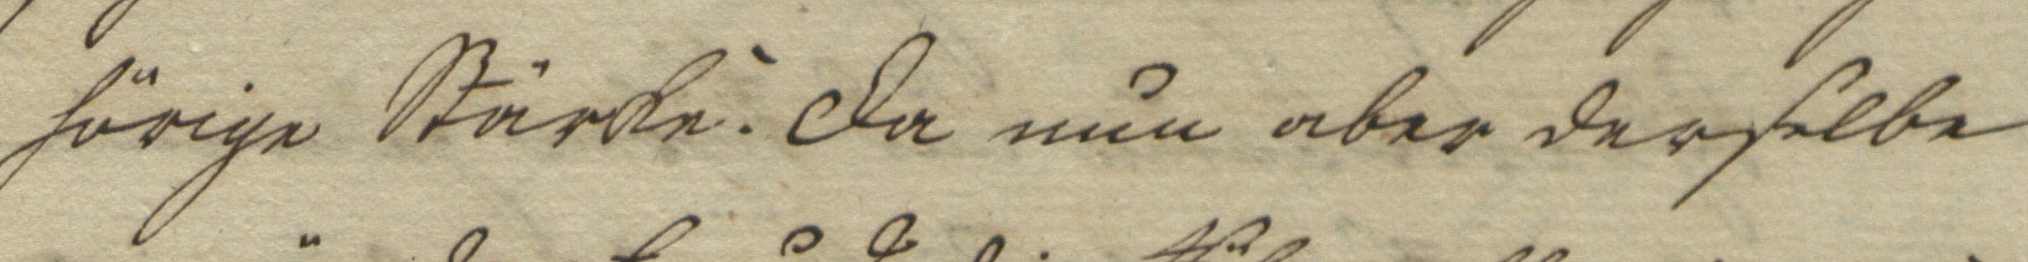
hörige Stärcke. Da nun aber derselbe
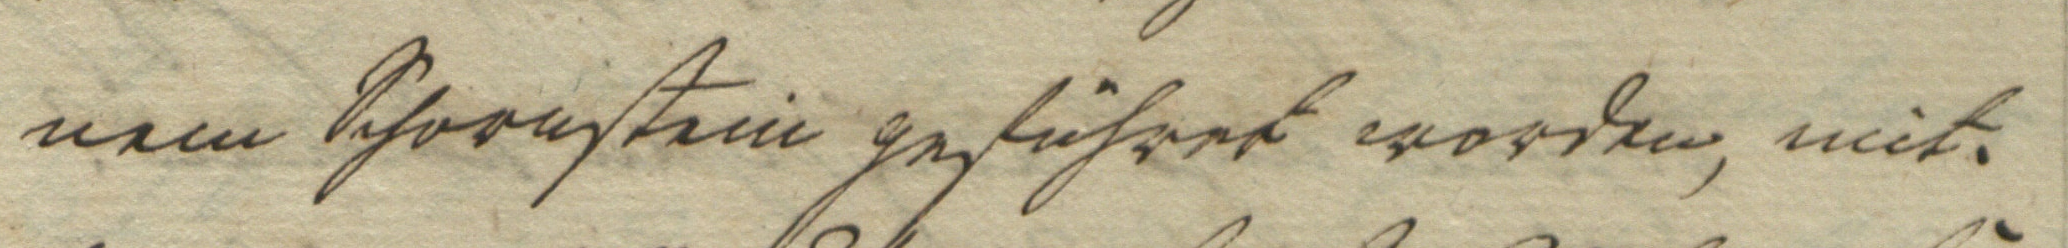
nem Schornstein geführet worden, mit¬
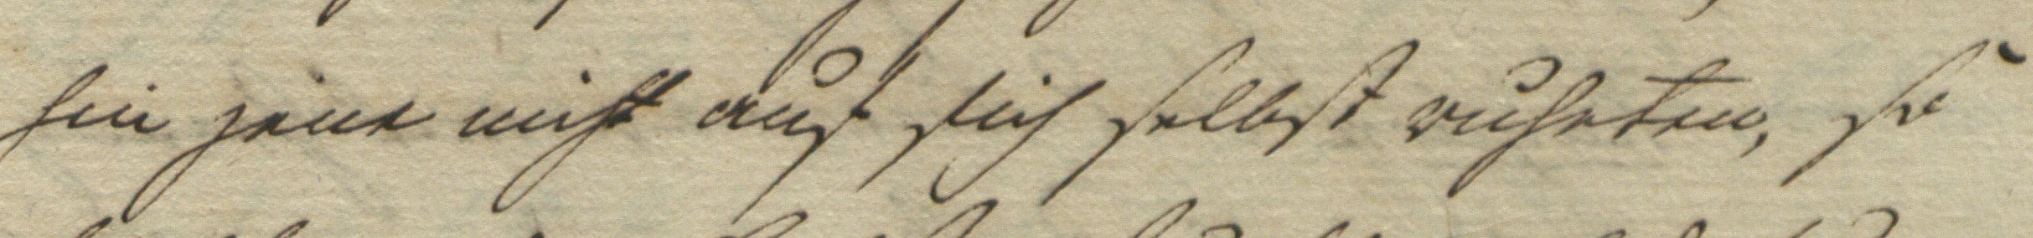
hin jene nicht auf sich selbst ruheten, so
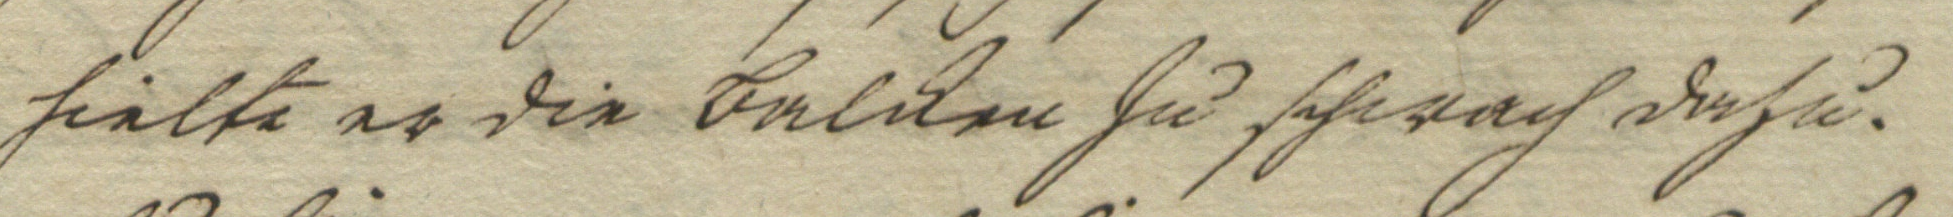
hielte er die Balcken zu schwach dazu.
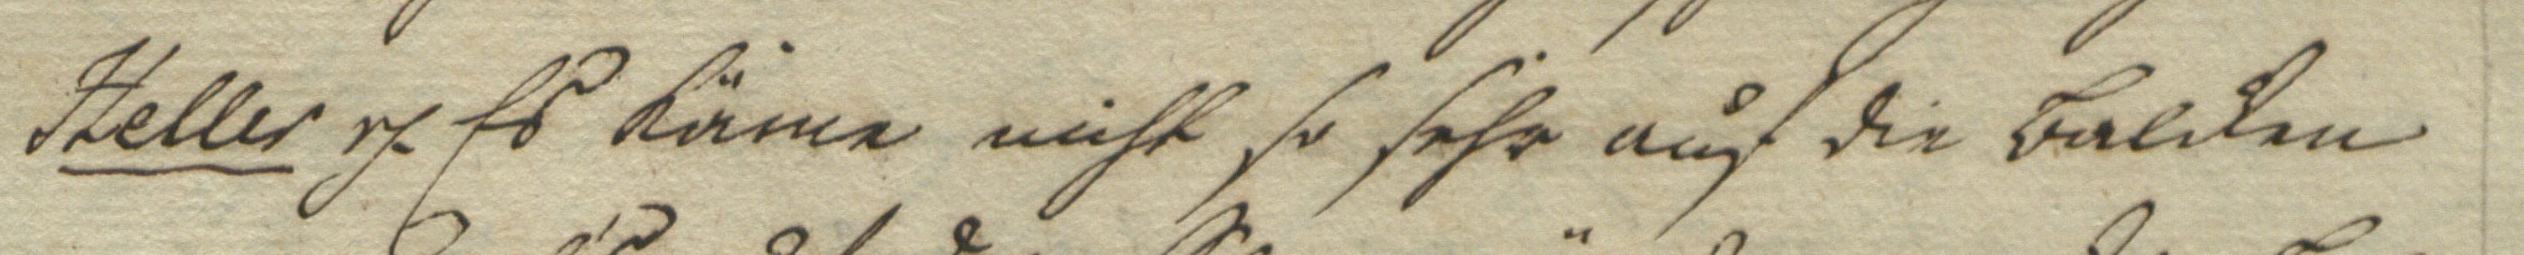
Heller rf. Es käme nicht so sehr auf die Balcken
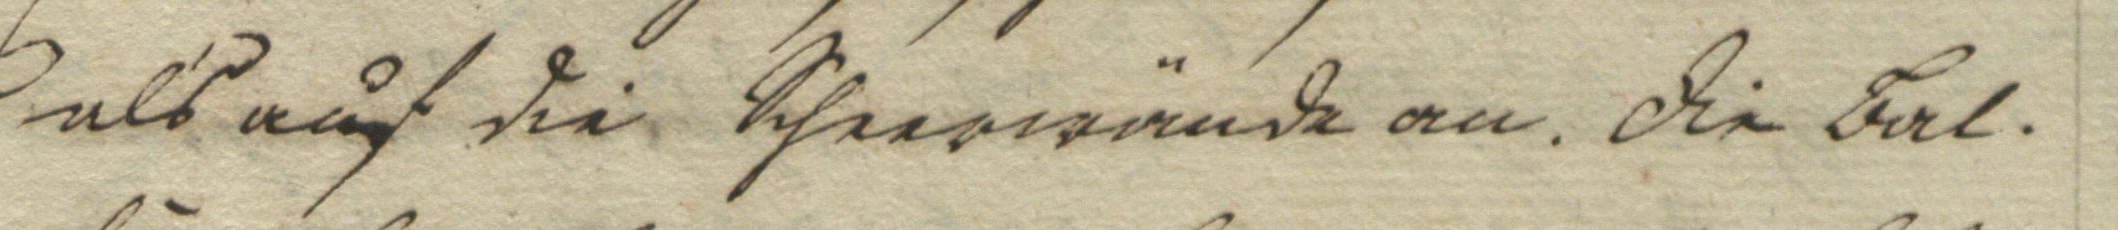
als auf die Scheerwände an. Die Bal¬
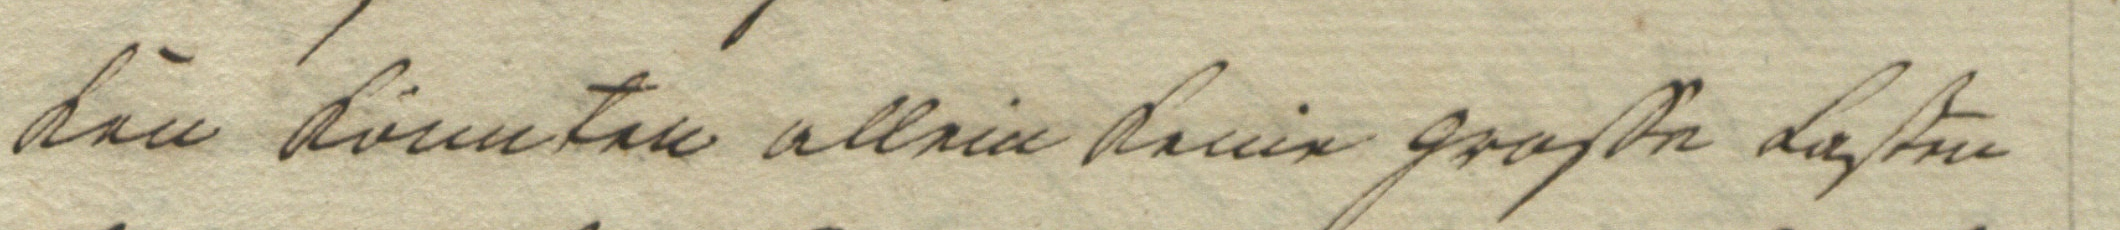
ken könnten allein keine grosse Lasten
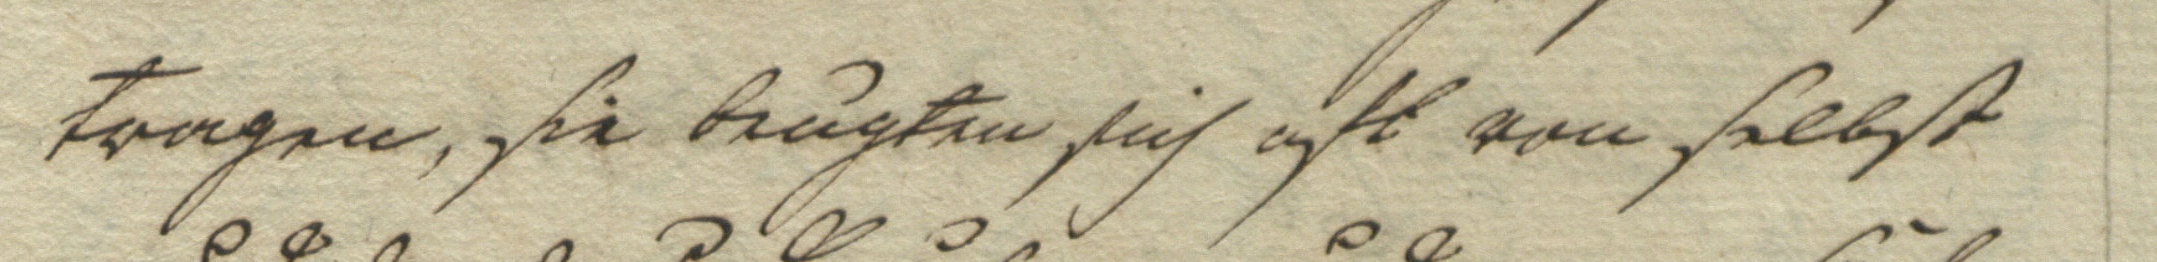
tragen, sie beugten sich oft von selbst
